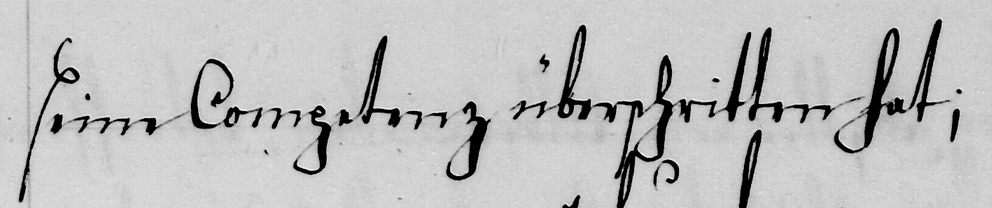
seine Competenz überschritten hat;
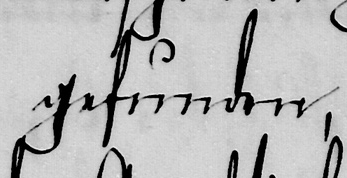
gefunden,
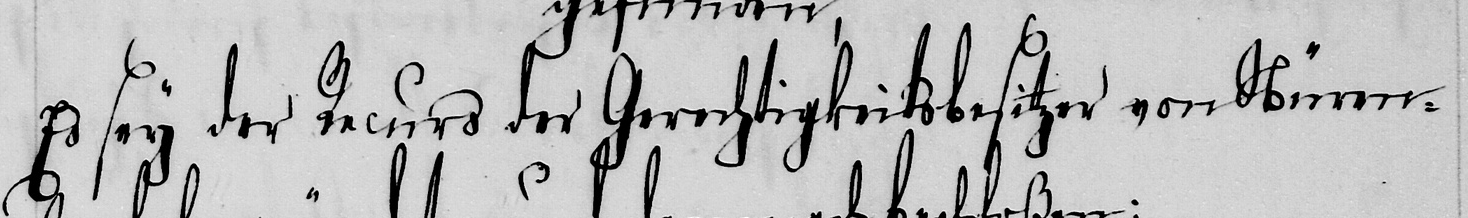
Es sey der Recurs der Gerechtigkeitsbesitzer von Nüren¬
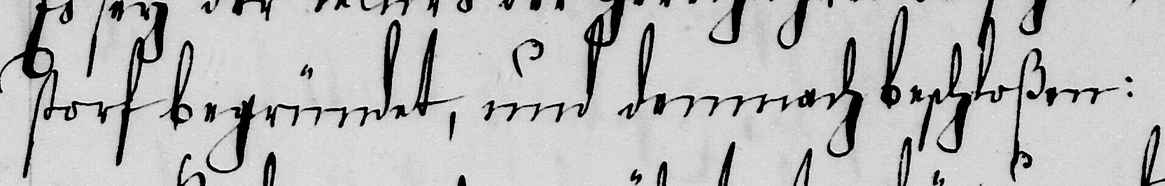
storf begründet, und demnach beschloßen:
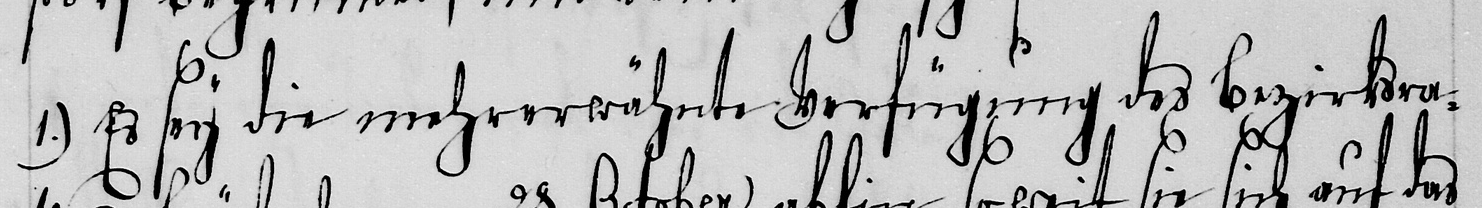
1.) Es sey die mehrerwähnte Verfügung des Bezirksra¬
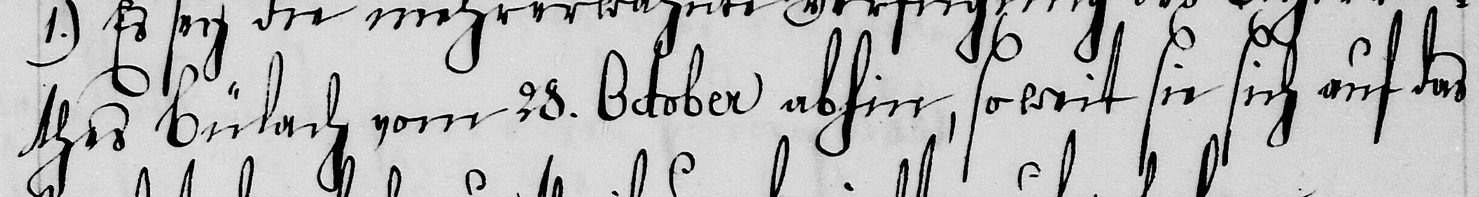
thes Bülach vom 28. October abhin, so weit sie sich auf das
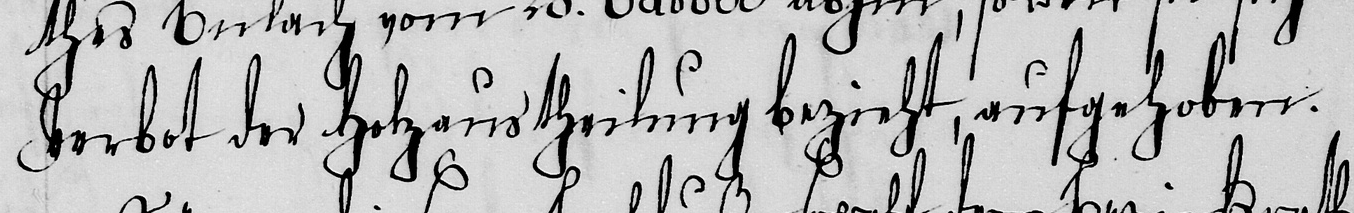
Verbot der Holzaustheilung bezieht, aufgehoben.
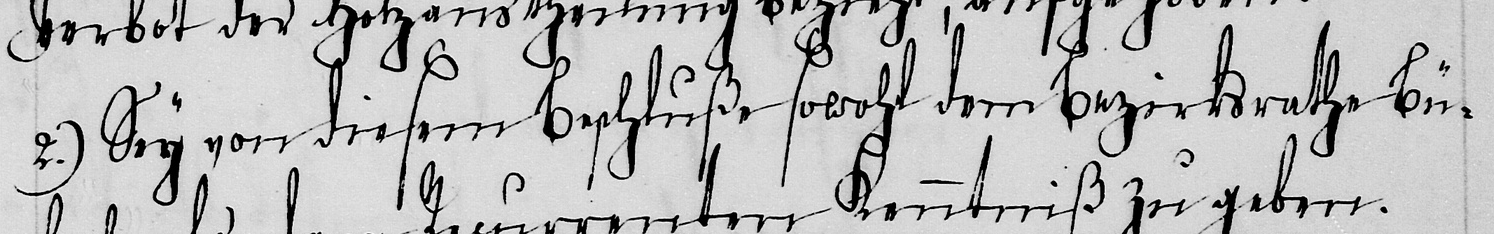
2.) Sey von diesem Beschluße sowohl dem Bezirksrathe Bü¬
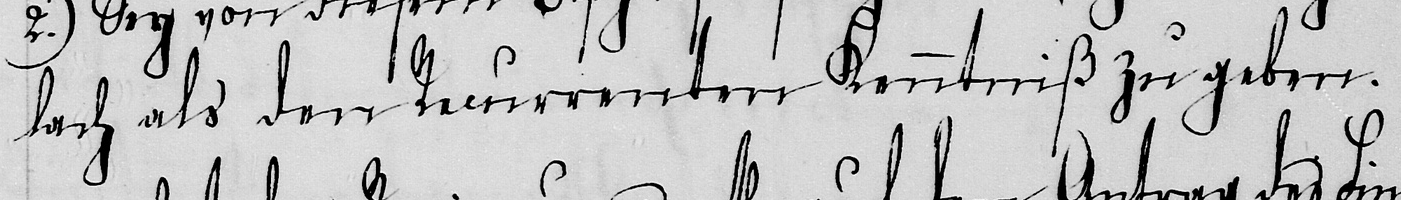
lach als dem Recurrenten Kenntniß zu geben.
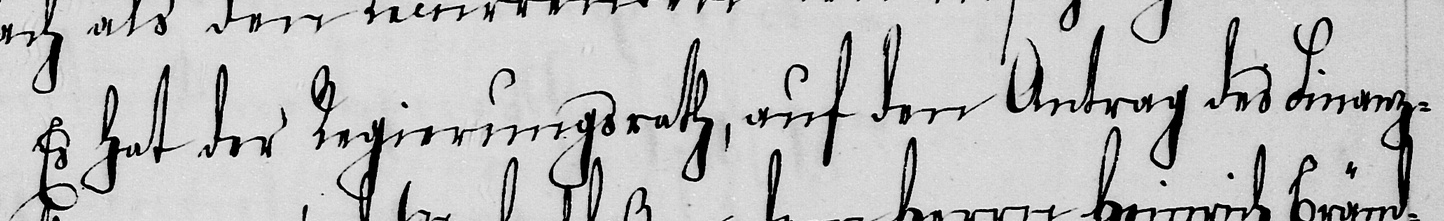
Es hat der Regierungsrath, auf den Antrag des Finan¬
